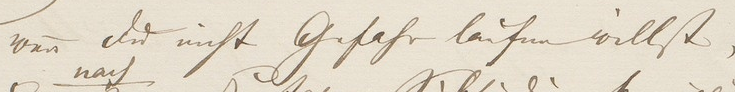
wenn Du nicht Gefahr laufen willst,
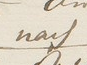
auch
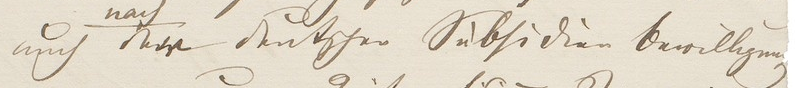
nach der deutschen Subsidien Bewilligung
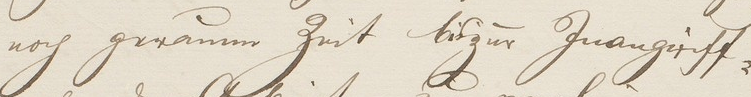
noch geraume Zeit bis zur Inangriff-
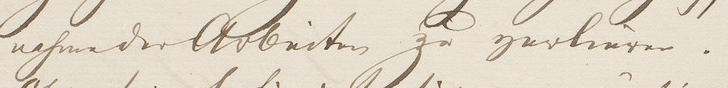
nahme der Arbeiten zu verlieren.
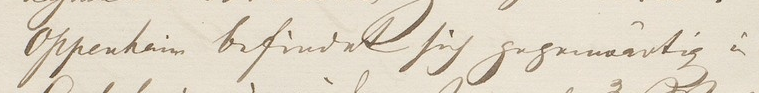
Oppenheim befindet sich gegenwärtig in
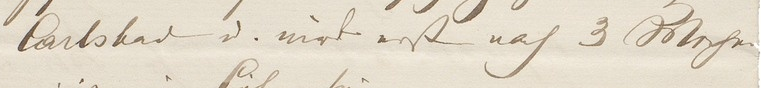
Carlsbad u. wird erst nach 3 Wochen
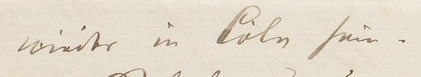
wieder in Cöln sein.
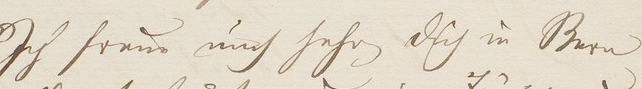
Ich freue mich sehr Dich in Bern
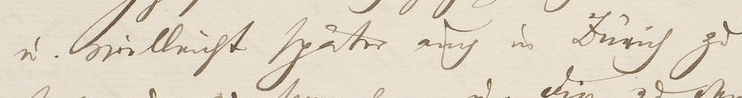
u. vielleicht später auch in Zürich zu
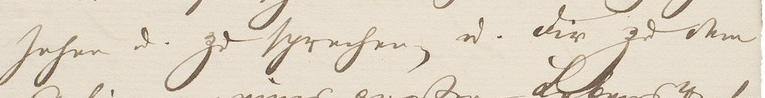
sehen u. zu sprechen, u. Dir zu dem
